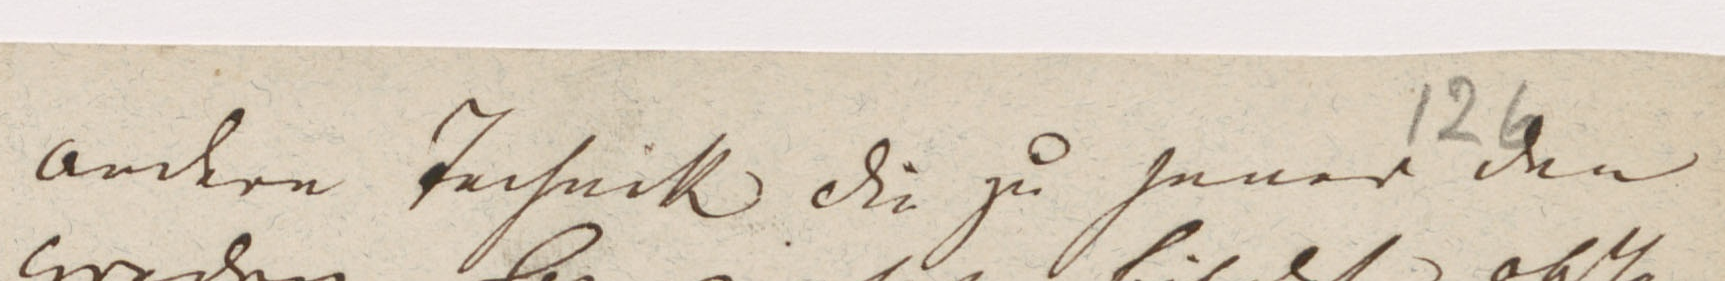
andern Technik die zu jener den
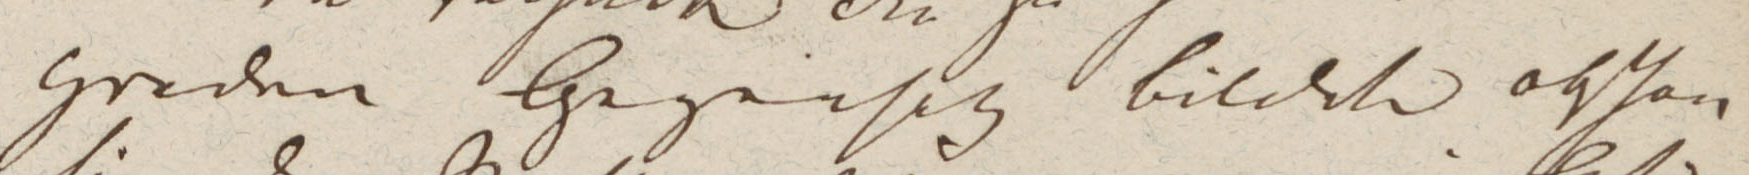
graden Gegensatz bildet obschon
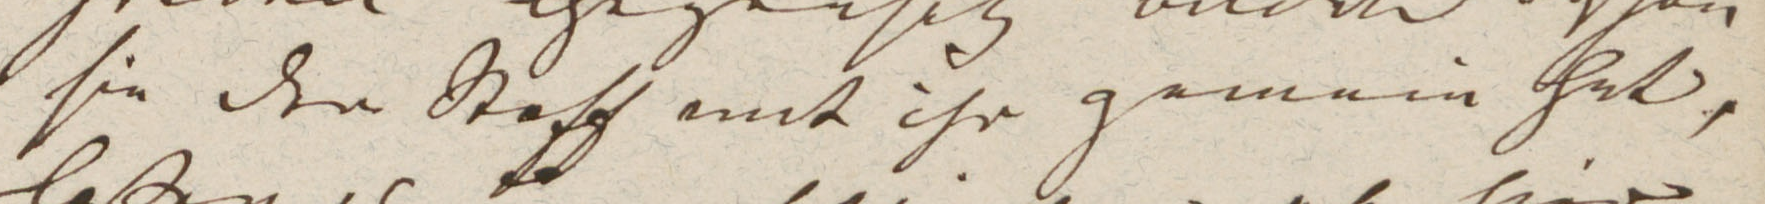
sie der Stoff mit ihr gemein hat,
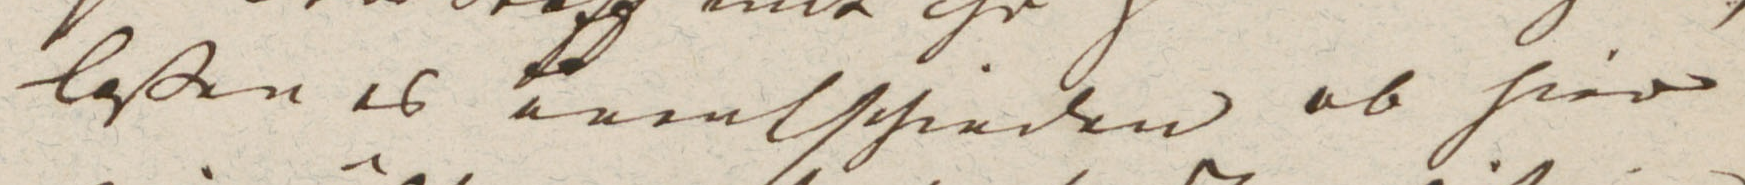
lassen es unentschieden ob hier
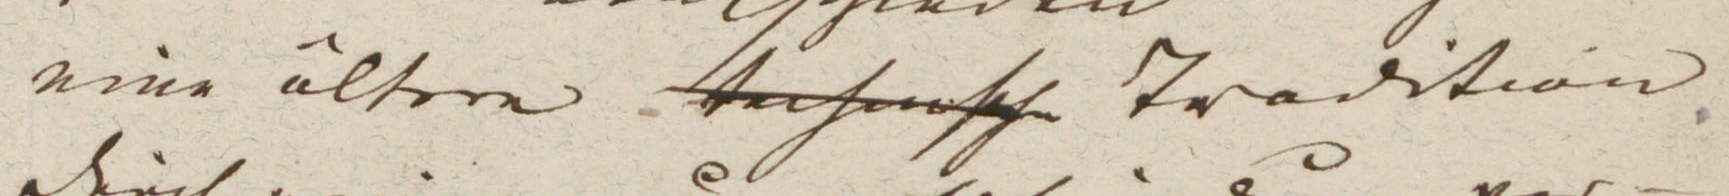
eine ältere technische Tradition
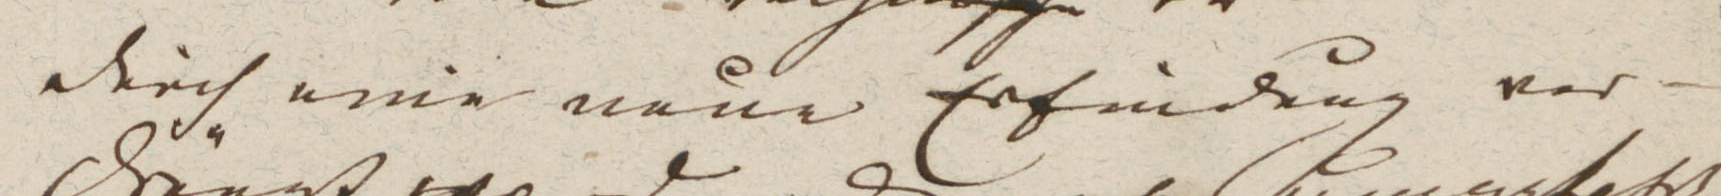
durch eine neue Erfindung ver-
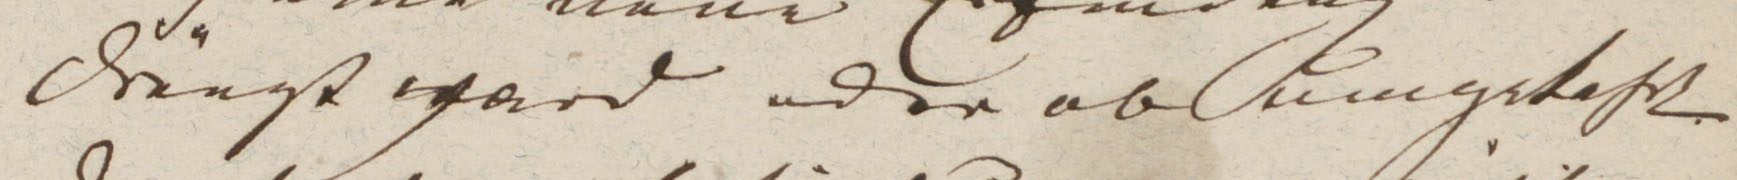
drängt ward oder ob umgekehrt
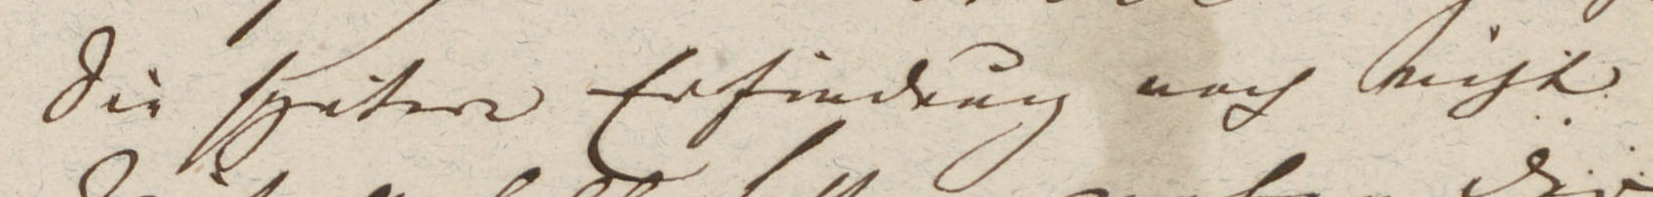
die spätere Erfindung noch nicht
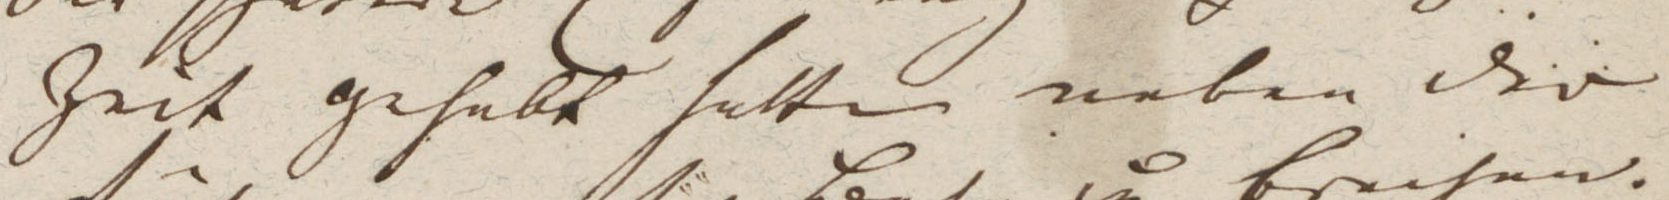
Zeit gehabt hatte neben der
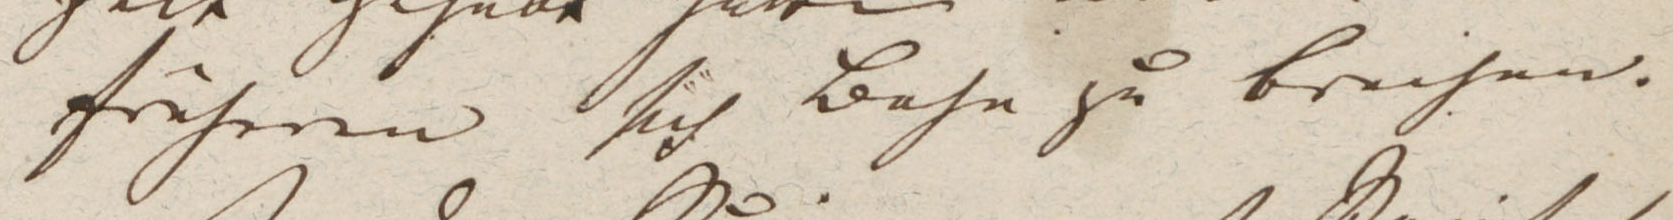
früheren sich Bahn zu brechen.
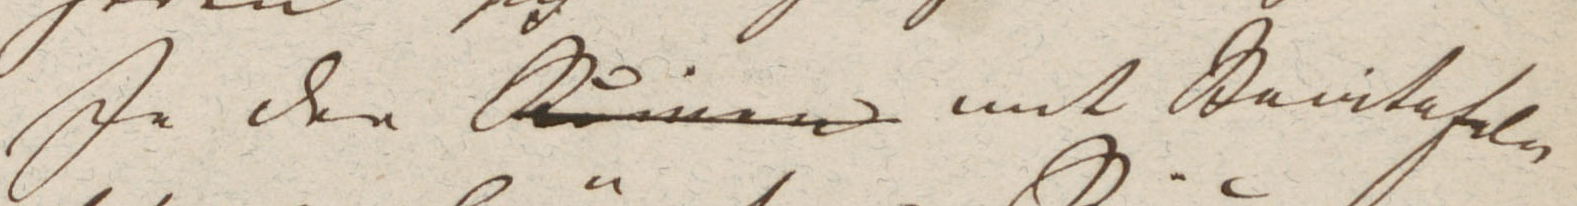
In den Räumen mit Steintafeln
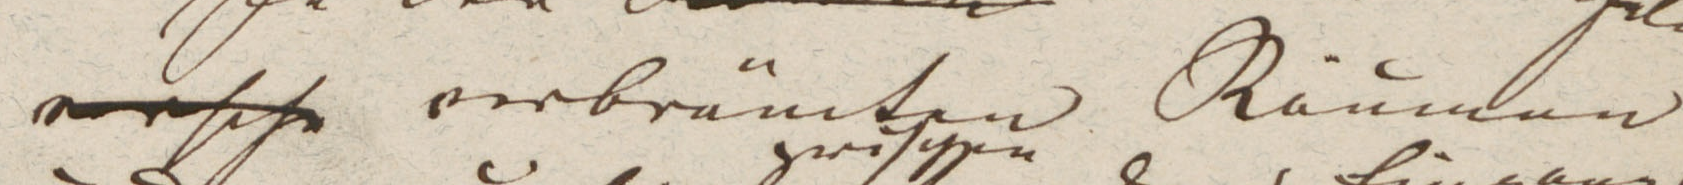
versch verbrämten Räumen
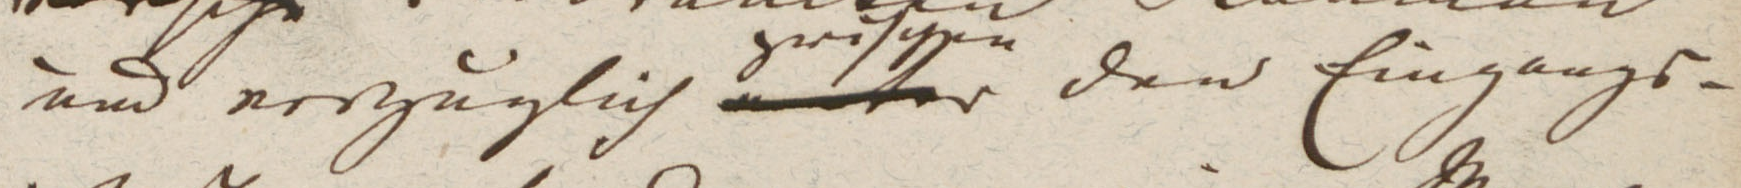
und vorzüglich unter zwischen den Eingangs-
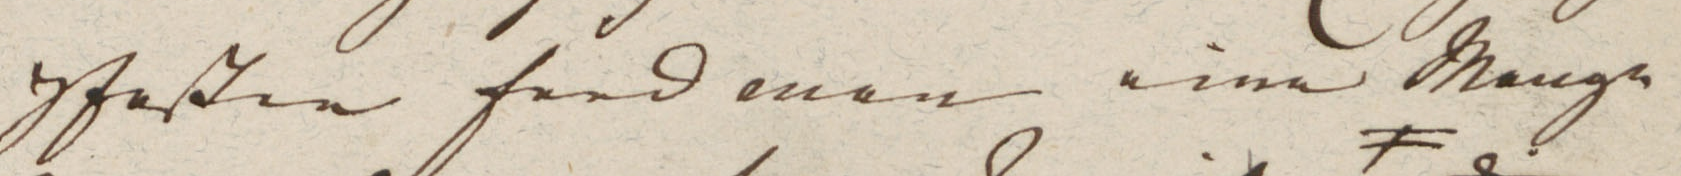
pfosten fand man eine Menge
